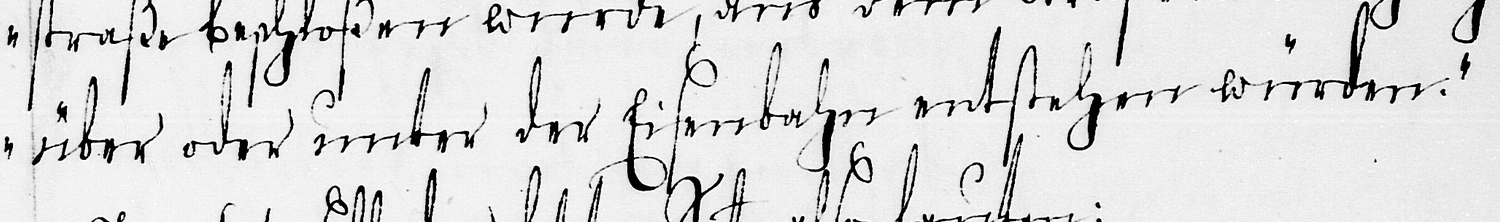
über oder unter der Eisenbahn entstehen würden.“
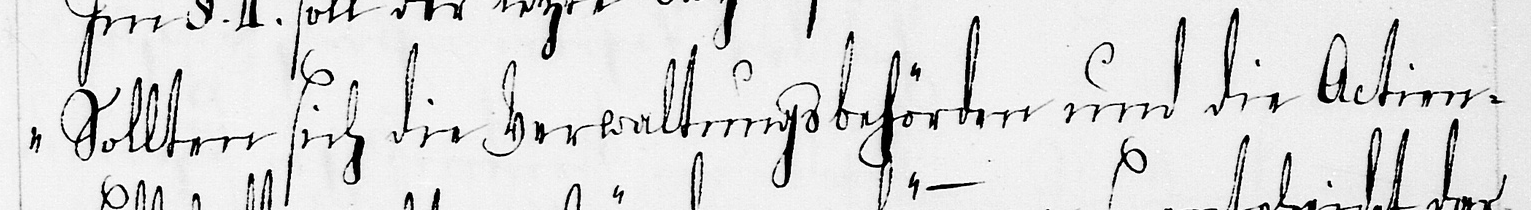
„Sollten sich die Verwaltungsbehörden und die Actien¬
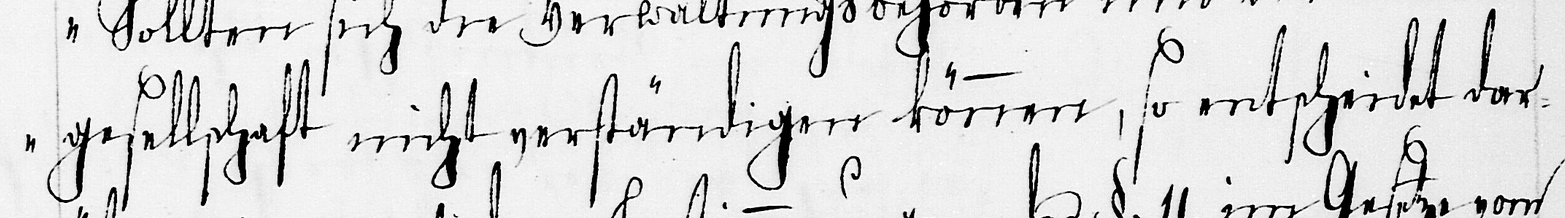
gesellschaft nicht verständigen können, so entscheidet dar¬
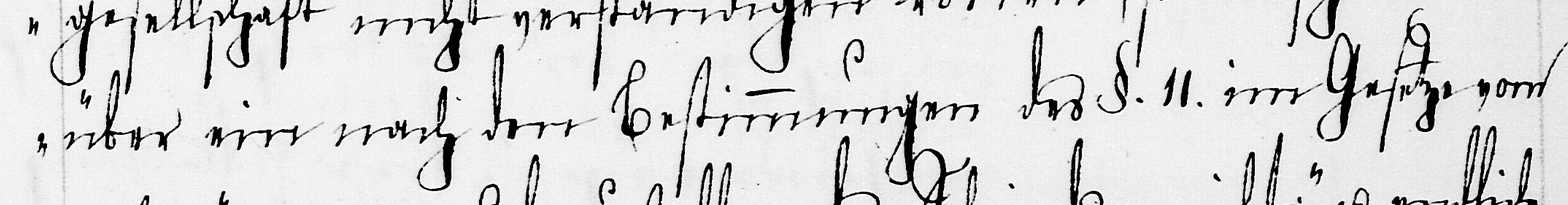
über ein nach den Bestimmungen des §. 11. im Gesetze vom
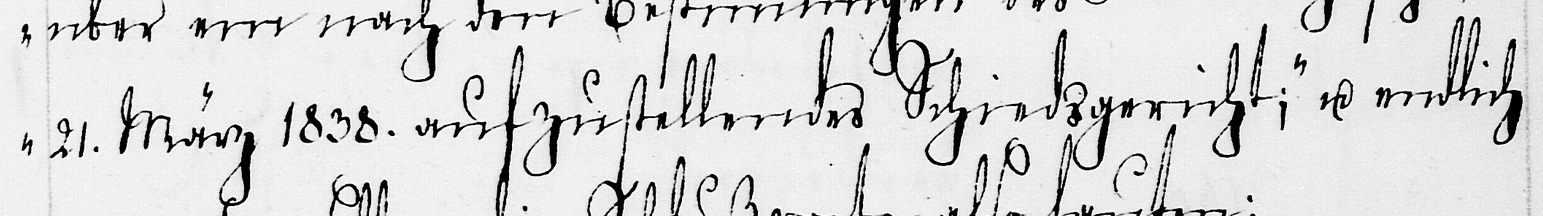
21. März 1838. aufzustellendes Schiedsgericht;“ u. endlich
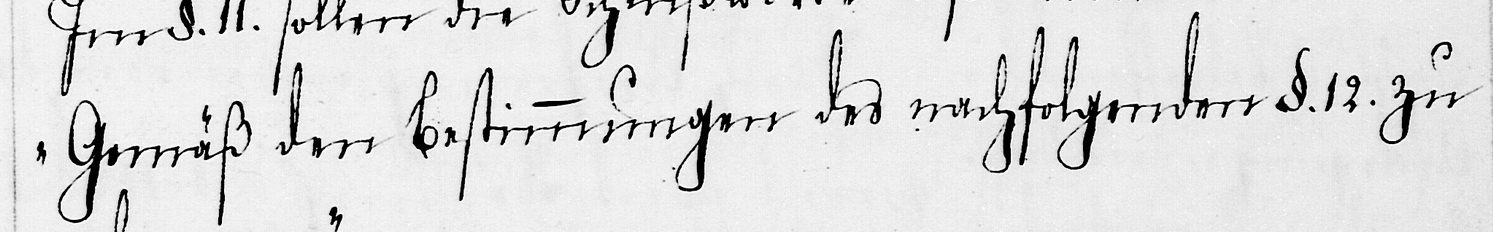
„Gemäß den Bestimmungen des nachfolgenden §. 12. zu
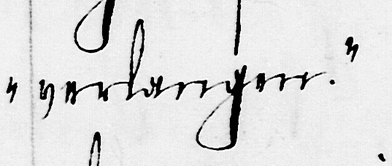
verlangen.“
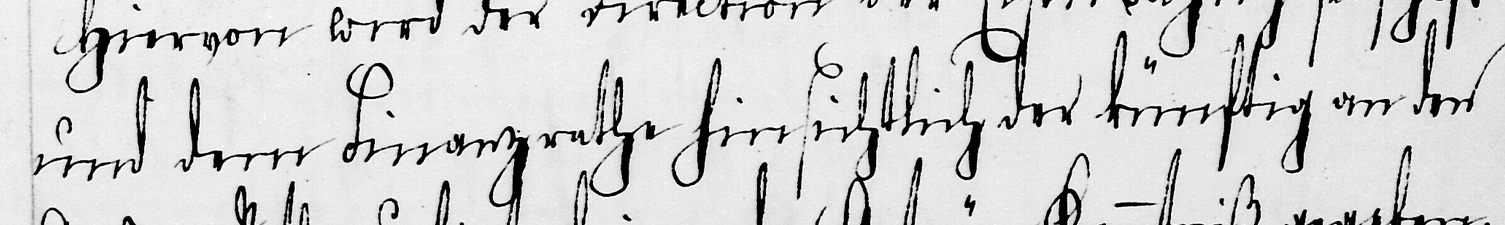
und dem Finanzrathe hinsichtlich der künftig an den
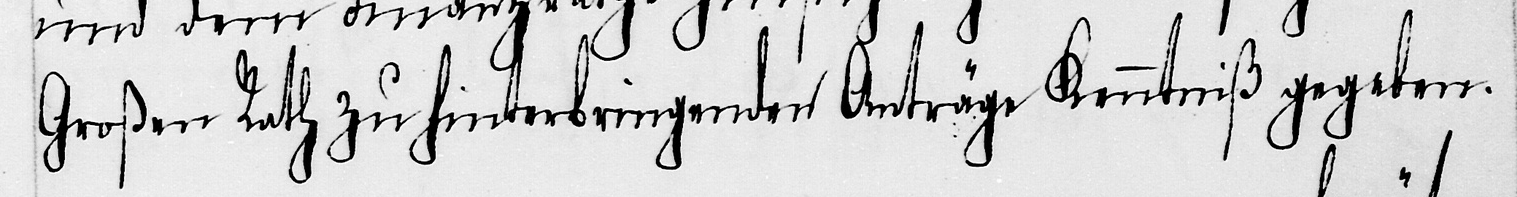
Großen Rath zu hinterbringenden Anträge Kenntniß gegeben.
